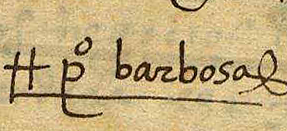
po barbosa
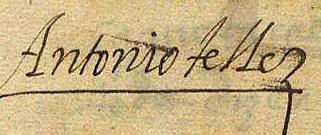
Antonio tellez
